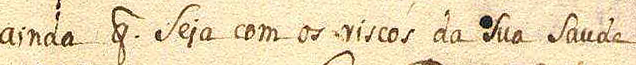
ainda q̄. Seja com os riscos da Sua Saude
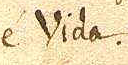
é Vida.
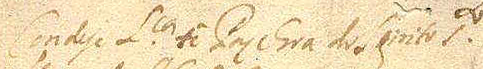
Condese L.ca té Paschoa do Spirito S.to
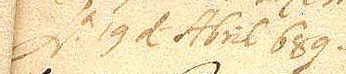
Lx.a 19 d̄ Abril 689.
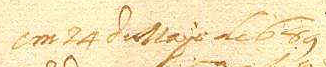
em 24 de Mayo de 689
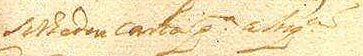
se lhe deu carta pa. a Inq.aõ
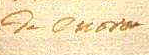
de Euora
